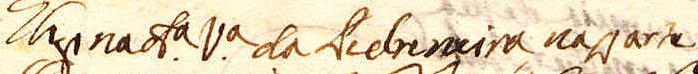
E Logo na d̄.a V.a da Pedreneira na parte
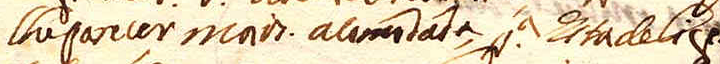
lhe parecer mais acomodada, p.a Esta delige
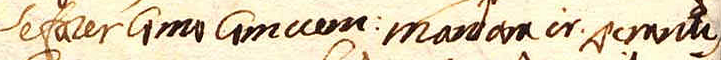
se fazer como Comuem: mandara ir perante
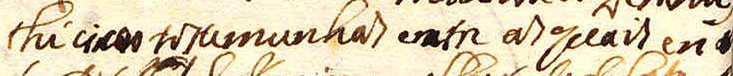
thé cinco testemunhas entre as quais e no
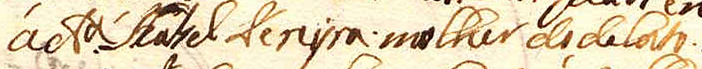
á d̄.a Izabel Pereyra molher do delato.
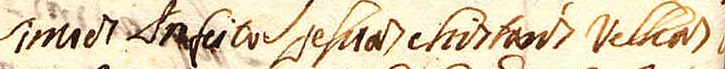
simoes Prefeito pessoas christan̄s velhas,
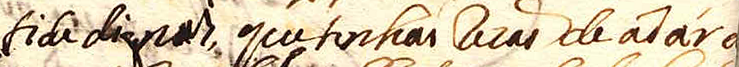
fidedignas, que tenhaõ Rezaõ de a dár e
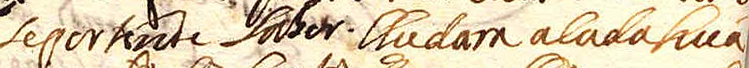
se pertente saber. lhe dara a Cada huā
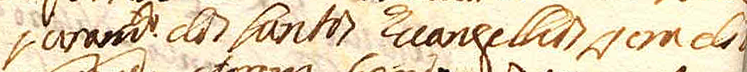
juramto dos santos Euangelhos pera di
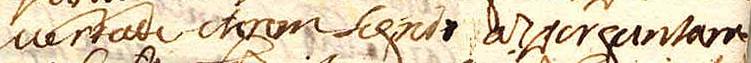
uerdade e terem segredo as perguntara
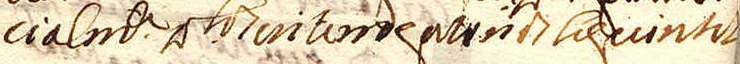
cialm.te pl.os innterrogatorios seguintes
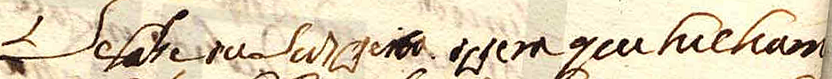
1 Se sabe ou suspeita o pera que he cham
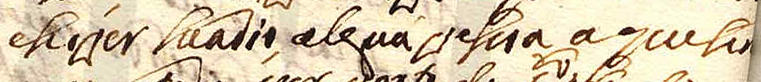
e ho persuadio, alguā pessoa a que hu
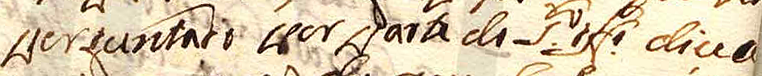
perguntado per parte do s.to off.o dicece
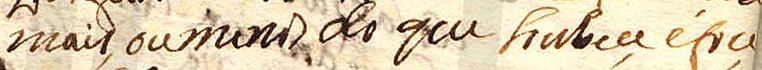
mais, ou menos do que soubece e foce
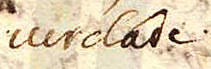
uerdade.
